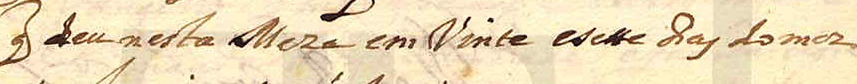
q̄ deu nesta Meza em Vinte e sette dias do mez
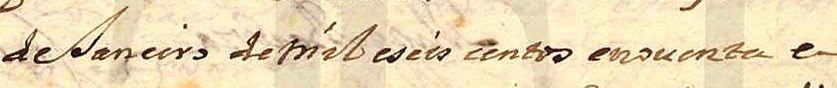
de Ianeiro de mil e seiscentos e nouenta e
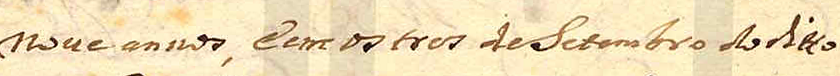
noue annos, e em os tres de Setembro do ditto
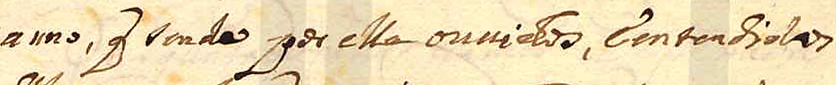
anno, q̄ sendo por ella ouuidos, e entendidos
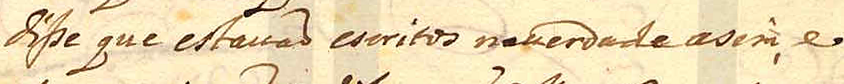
disse que estauaõ escritos na uerdade asim, e
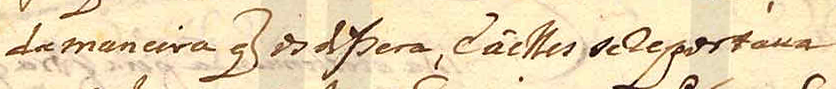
da maneira q̄ os dissera, e á elles se reportaua
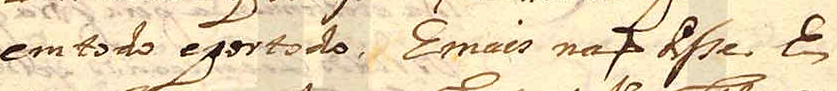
em todo e por todo. E mais naõ disse. E
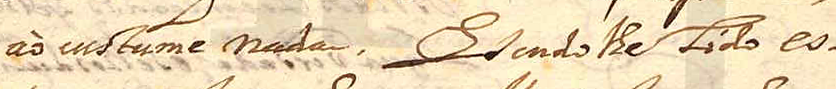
ao custume nada. E sendolhe Lido es
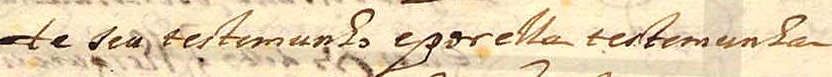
te seu testemunho e por ella testemunha
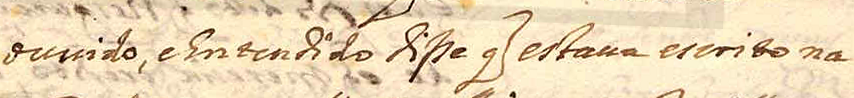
ouuido, e Entendido disse q̄ estaua escrito na
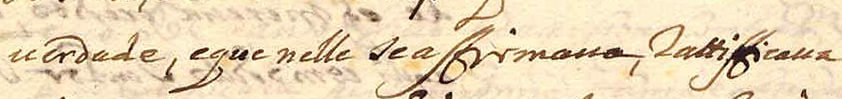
uerdade, e que nelle se affirmaua, Rattifficaua
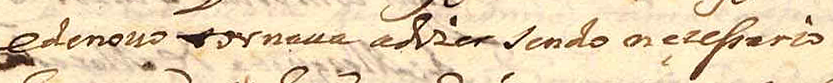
e de nouo tornaua a dizer sendo necessario.
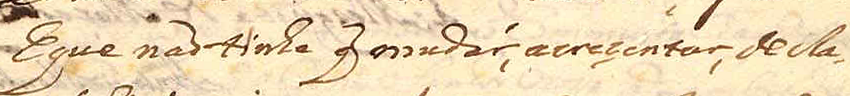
E que naõ tinha q̄ mudar, acrecentar, decla
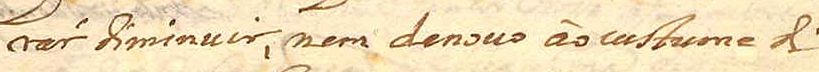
rar diminuir, nem de nouo ào custume di
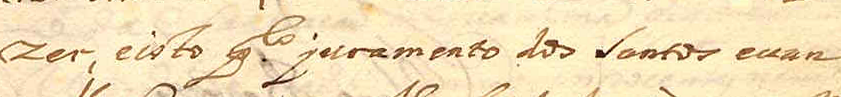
zer, e isto p.lo juramento dos Santos euan
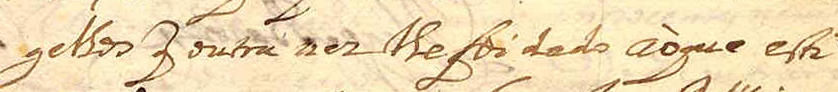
gelhos q̄ outra uez lhe foi dado ao que esti
